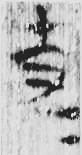十月
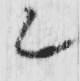乙
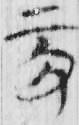亥
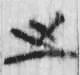之
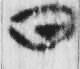日
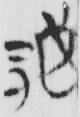○（越）
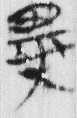異
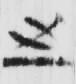之
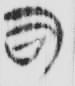司
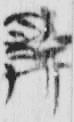敗
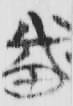番
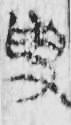受
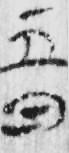○（期）
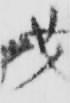戊
